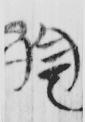陰
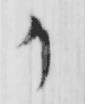人
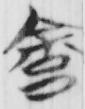舒
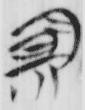○（盟）
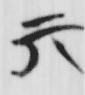亓（其）
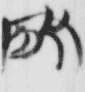所
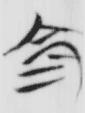命
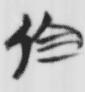於
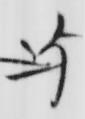此
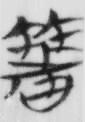箸（書）
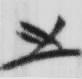之
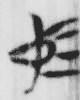𠁩
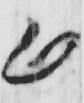㠯（以）
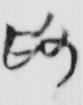爲
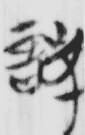○（證）
